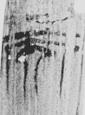而
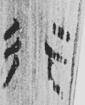行
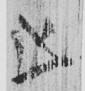之
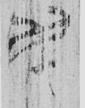民
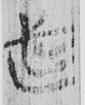必
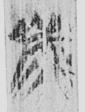備（服）
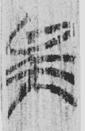矣
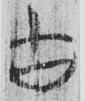古（故）
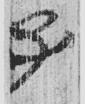子
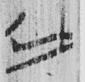㠯（以）
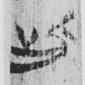此
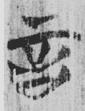言
